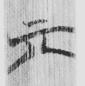亓
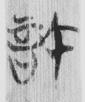許
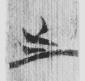之
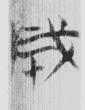成
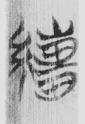{糸山畕}
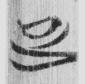疋
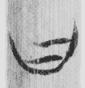曰
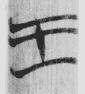王
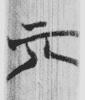亓
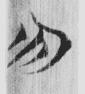勿
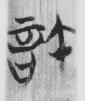許
